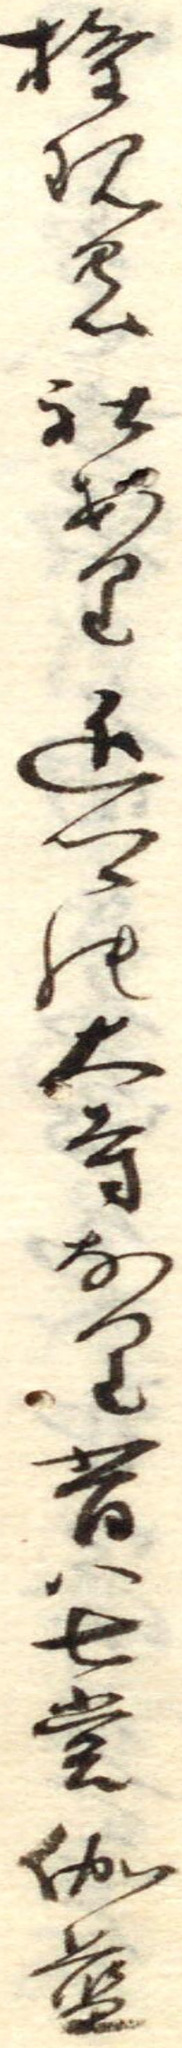権現の社あり近郷の大寺なり昔は七堂伽藍
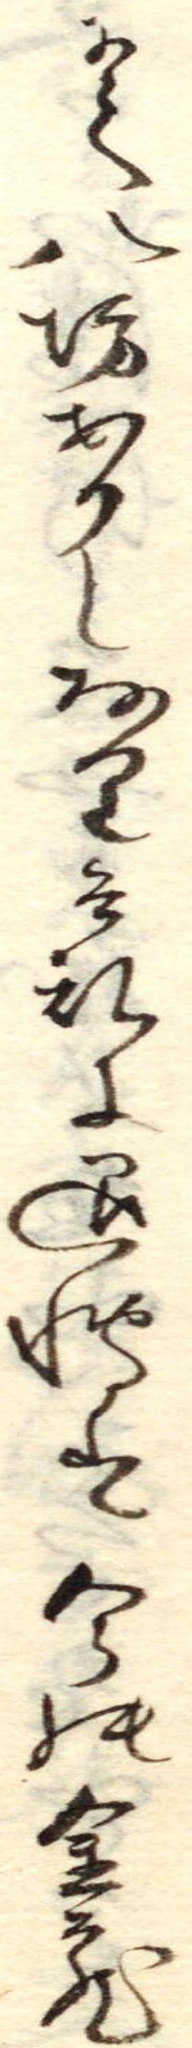にて八坊ありしなり兵乱に退転す今の金蔵
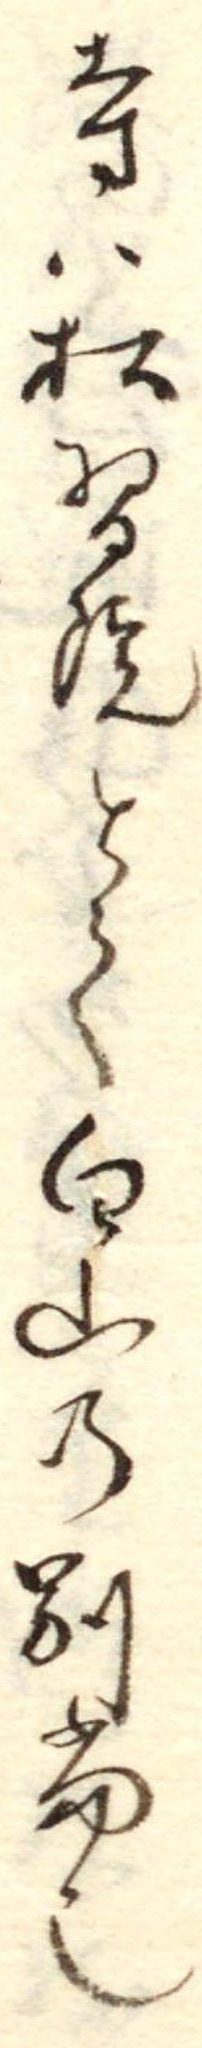寺は松習院とて白山の別当也
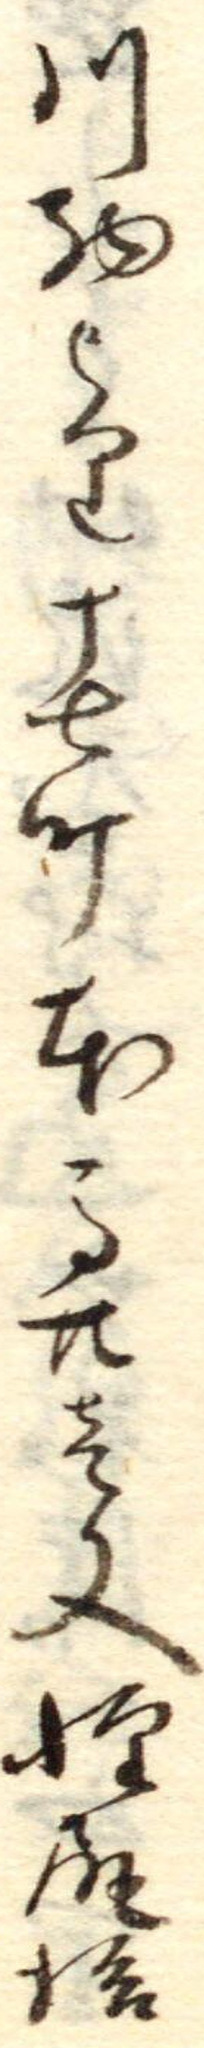川西より十七町本馬廿壱文軽尻拾
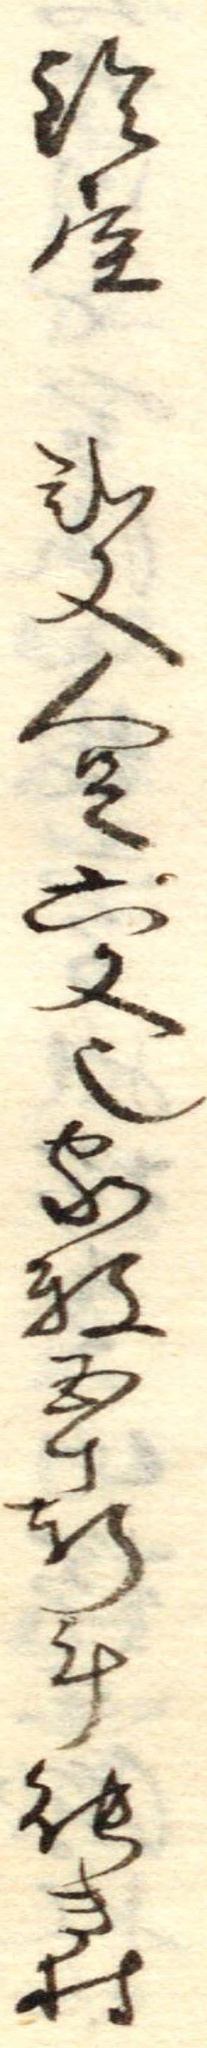鈴屋弐文人足六文也家数五十軒斗よき村
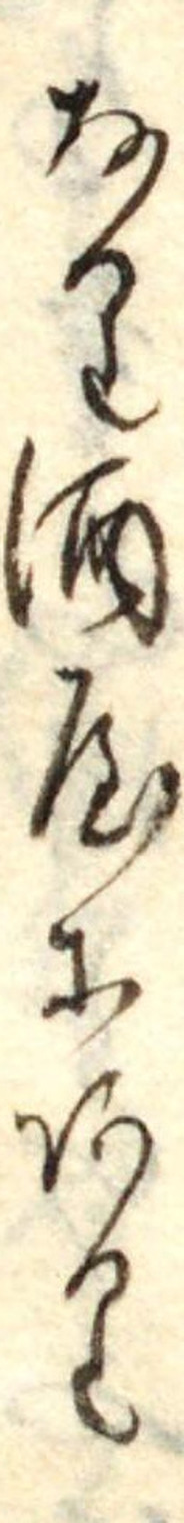なり酒屋等あり

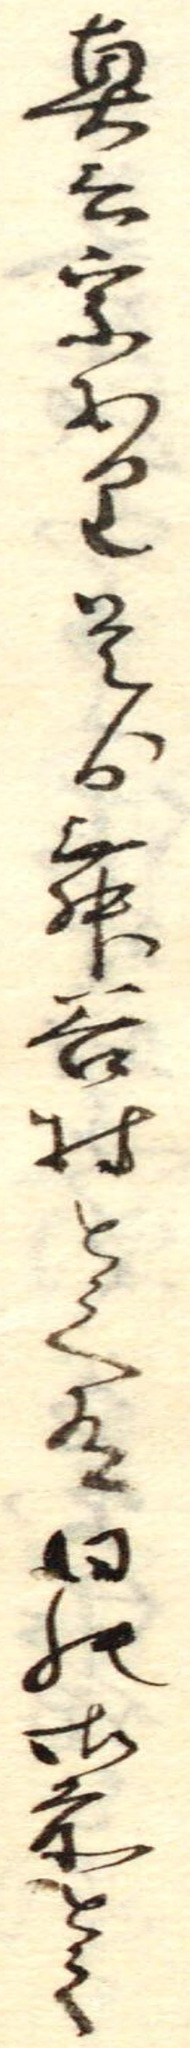真言宗あり是ゟ舞谷村とて有日の御前とて
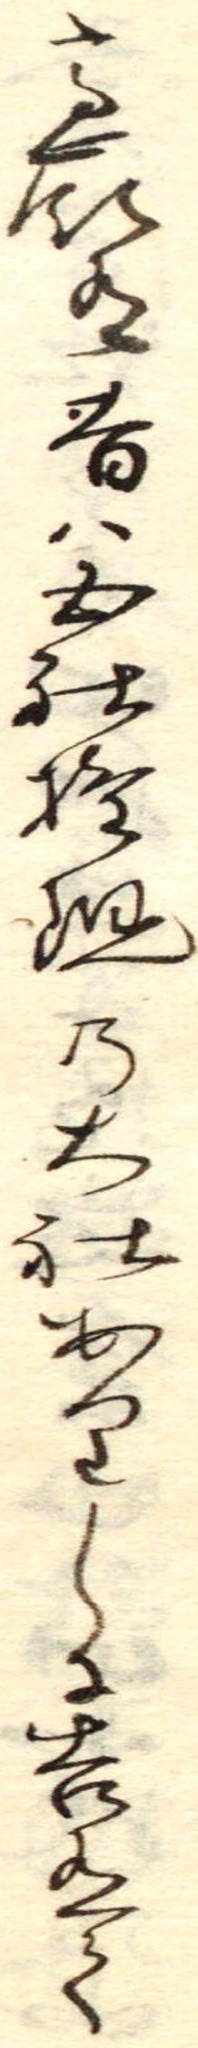寺領有昔は五社権現の大社ありしに告有て
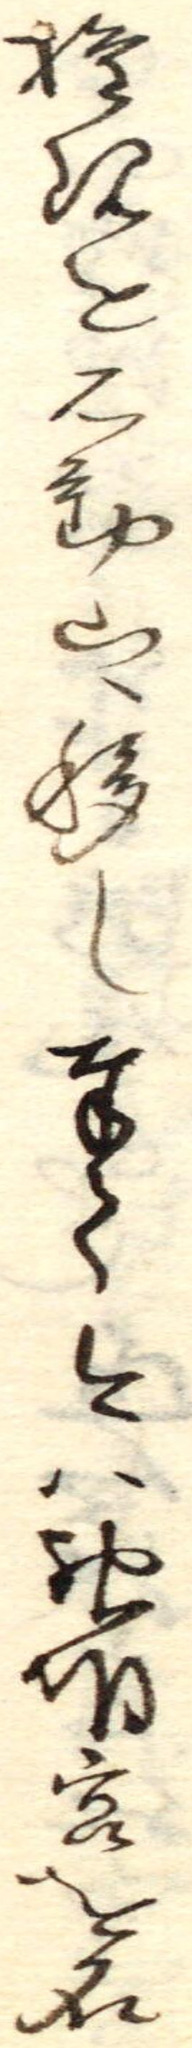権現を石動山へ移し奉て今は神明宮を石
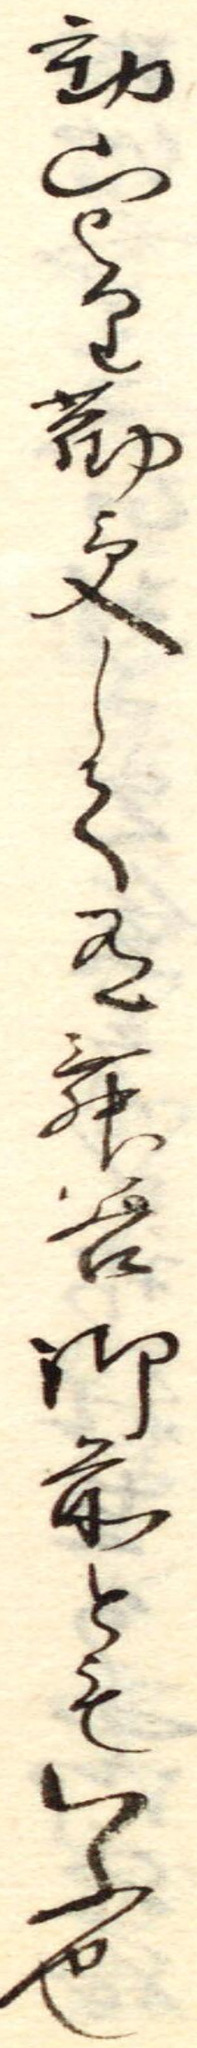動山より勧受して有舞谷御前ともいふ也
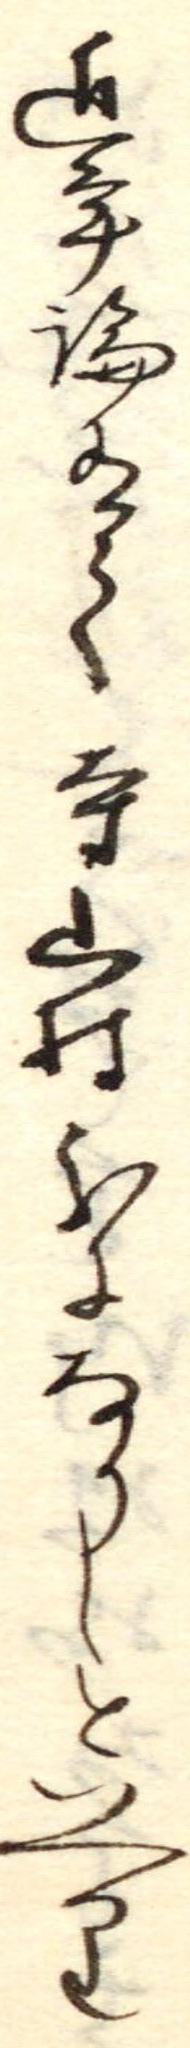近年論有寺山村分になりしといへり
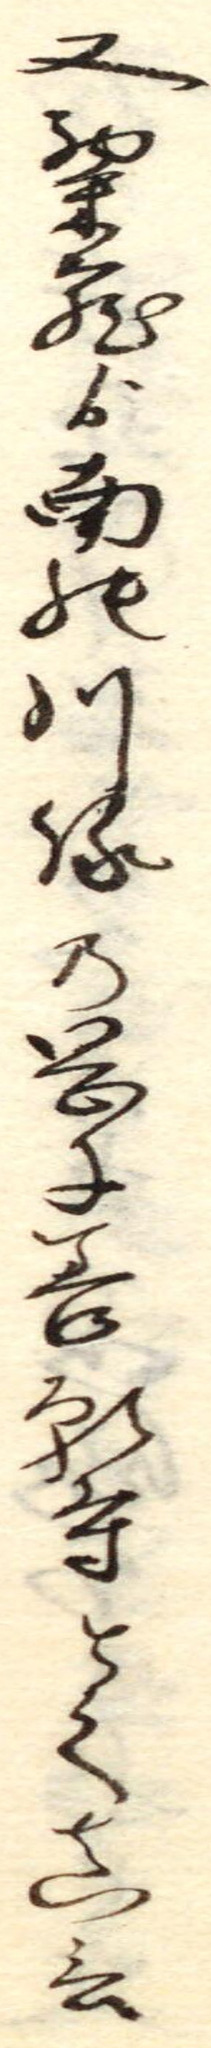又粟蔵ゟ南の川縁の岡に善願寺とて真言
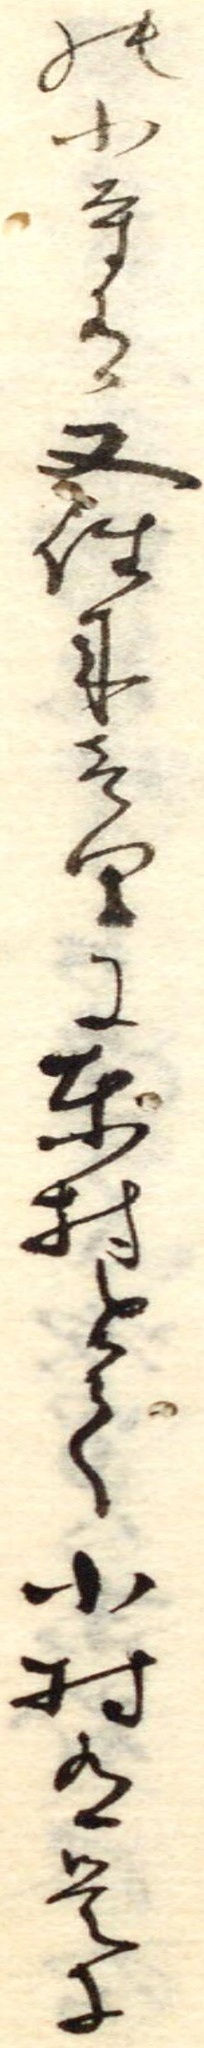の小寺有又往来壱里に東村とて小村有是に
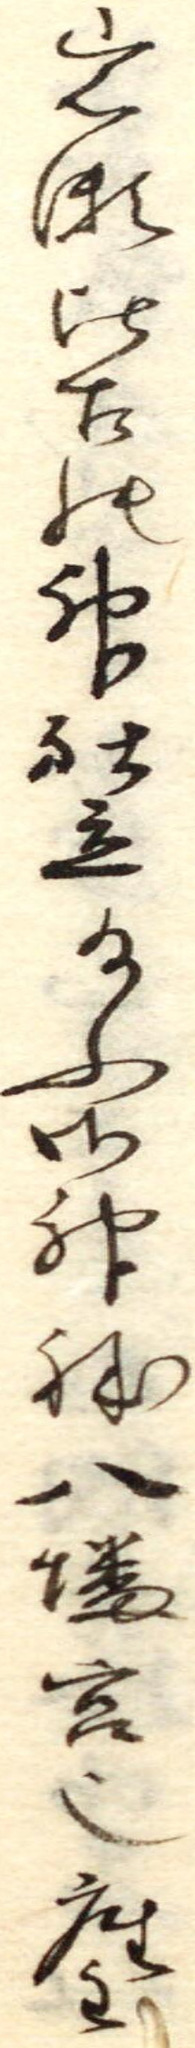岩瀬比古の神社立給ふ御神躰八幡宮也座主
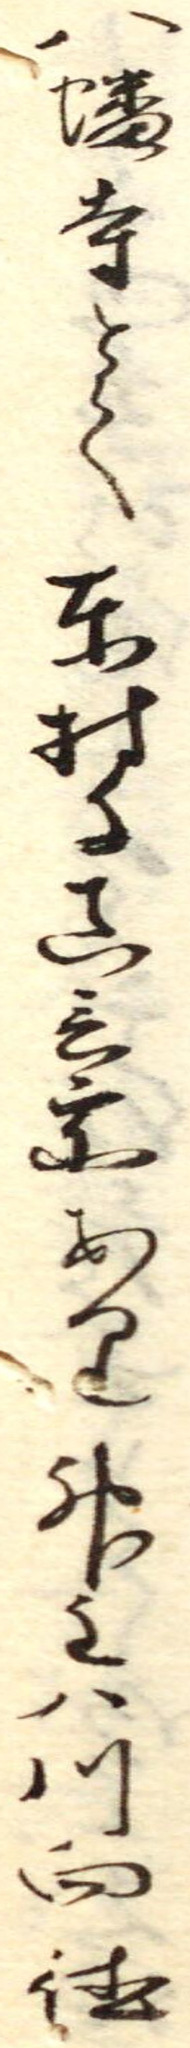八幡寺とて東村に真言宗あり神主は川向徳
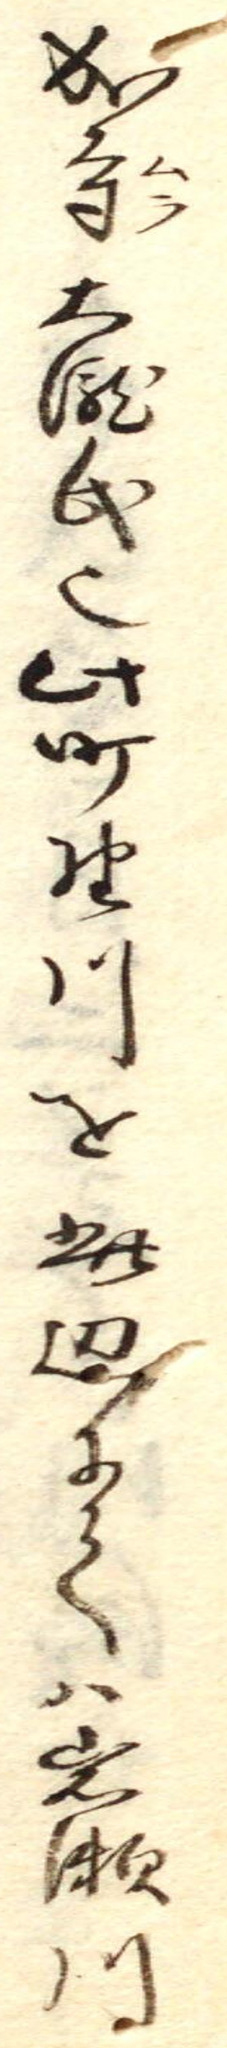成寺大瀧氏也此町野川を此辺にては岩瀬川
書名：能登名跡誌
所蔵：Ishikawa Prefectural Library
